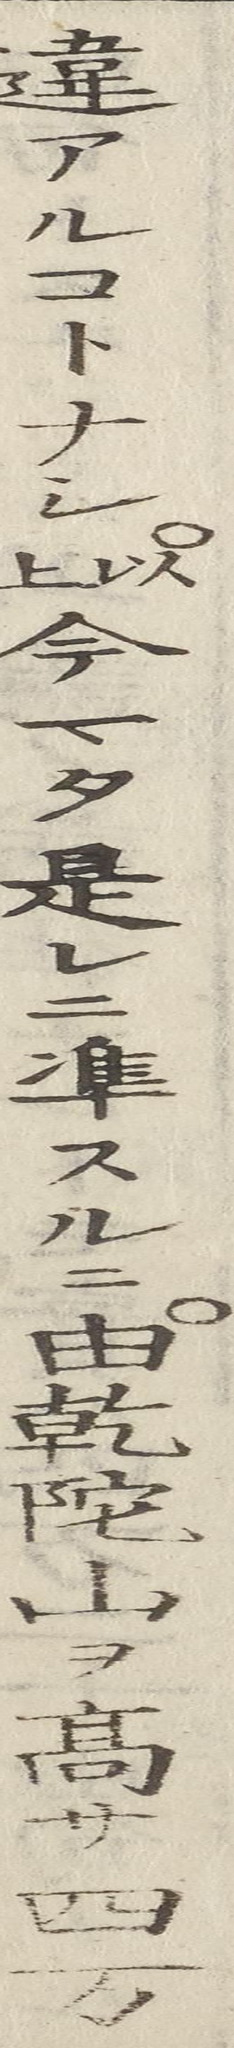違アルコトナシ。以上今マタ是レニ準スルニ。由乾陀山ヲ高サ四万

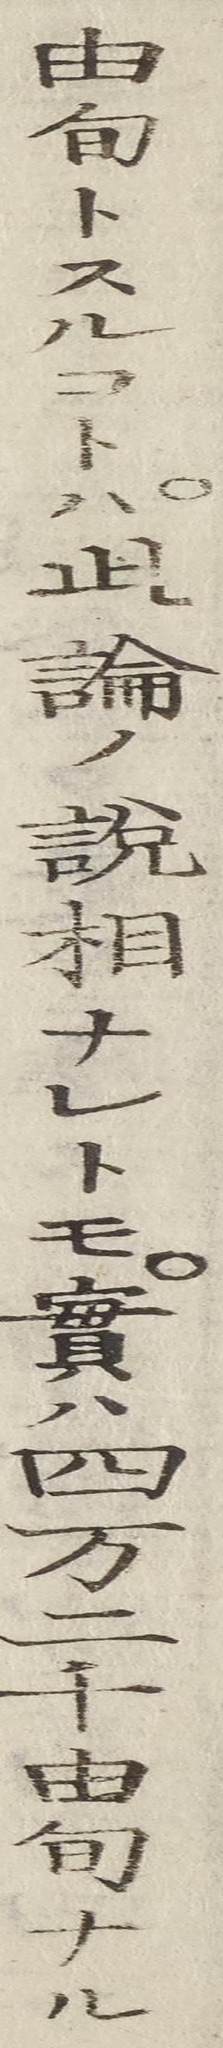由旬トスルコトハ。此論ノ説相ナレトモ。実ハ四万ニ千由旬ナル
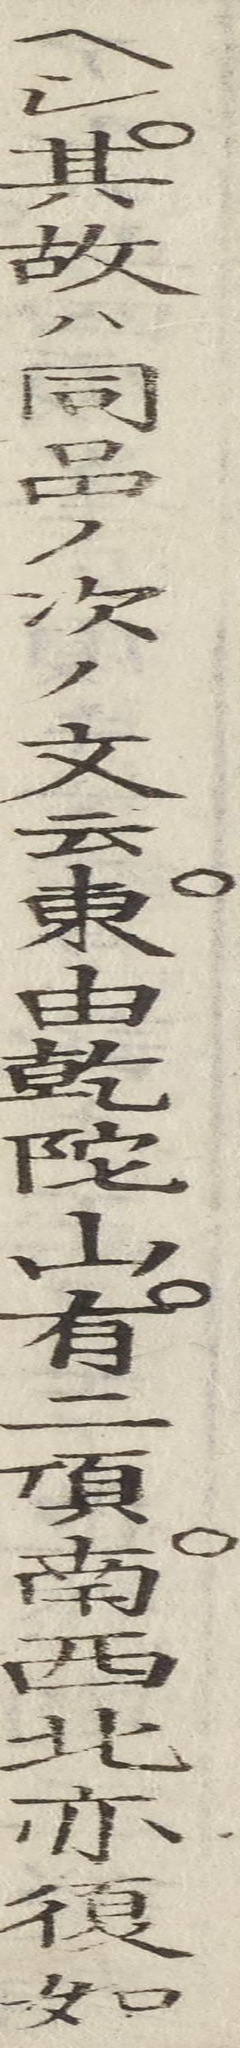ヘシ。其故ハ同品ノ次ノ文云。東由乾陀山。有ニ頂。南西北亦復如
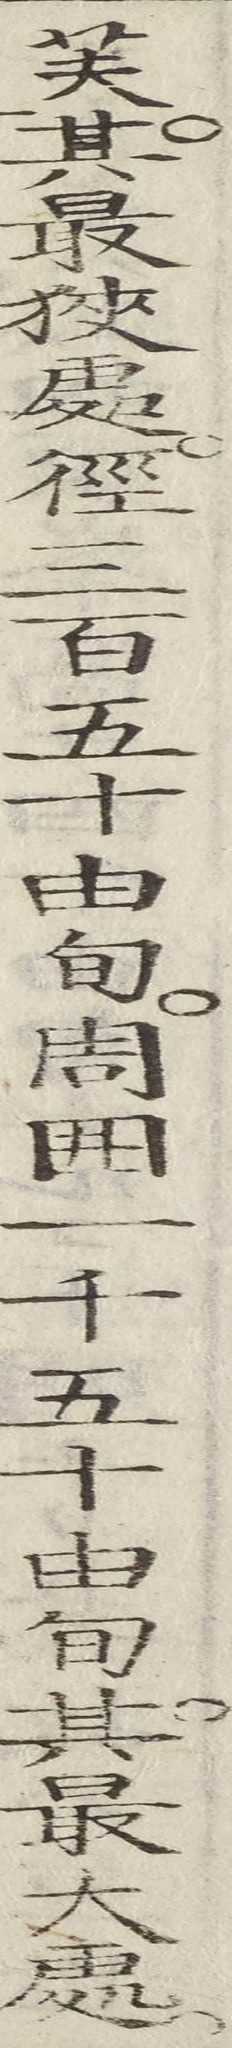芙。其最狭処。径三百五十由旬。周囲一千五十由旬。其最大処。
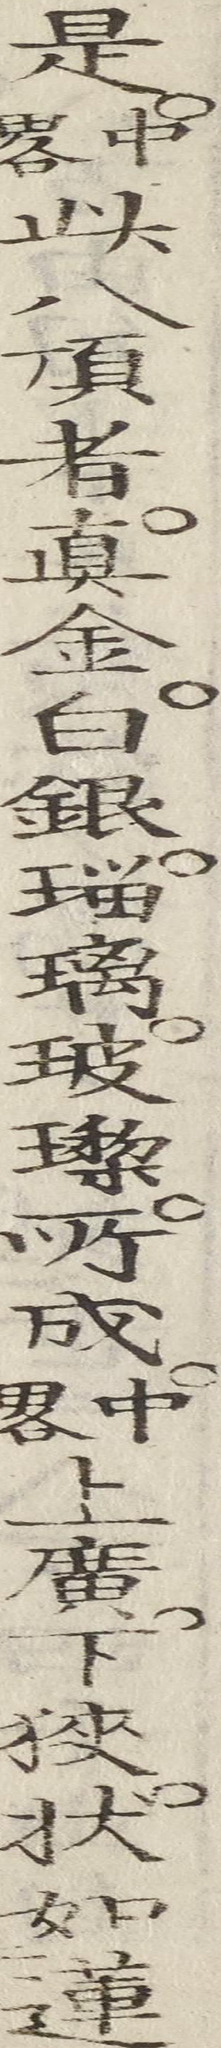是。中略此ハ頂者。真金。白銀。瑠璃。玻瓈。所成。中略上広。下狭。状如ニ蓮
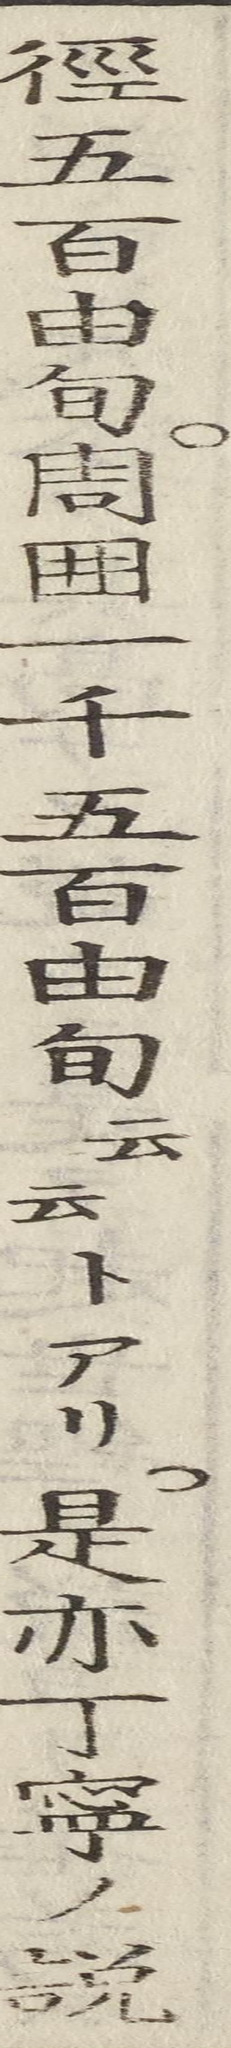径五百由旬.周囲一千五百由旬云云トアリ。是亦丁寧ノ説
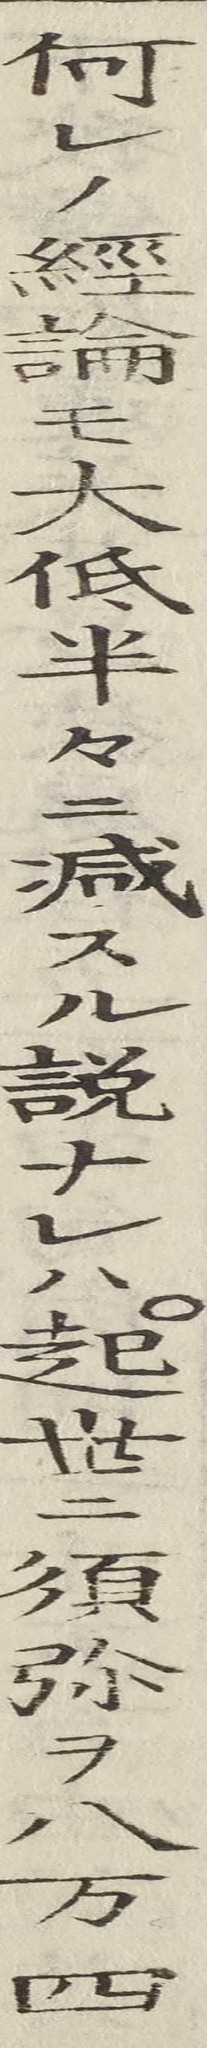何レノ経論モ大低半々ニ減スル説ナレハ。起世ニ須弥ヲ八万四
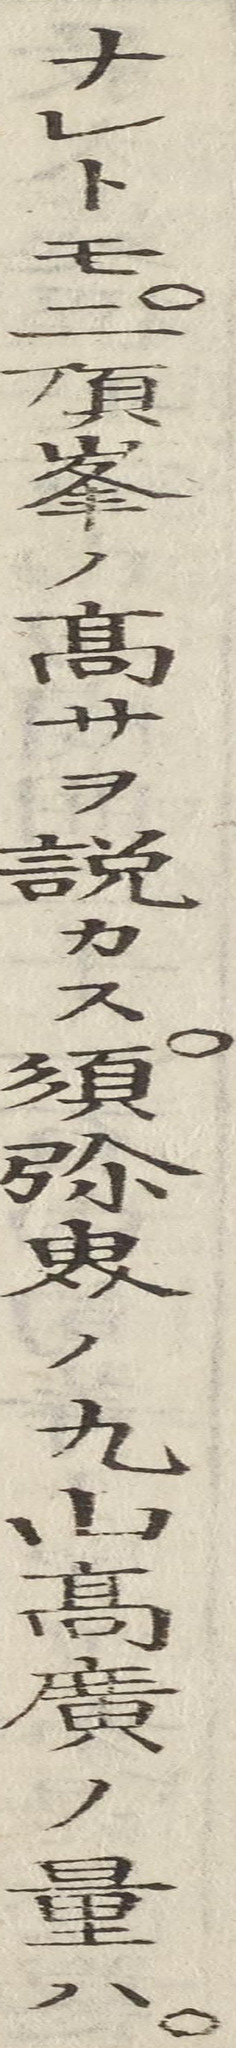ナレトモ。ニ頂峯ノ高サヲ説カス。須弥界ノ九山高広ノ量ハ。
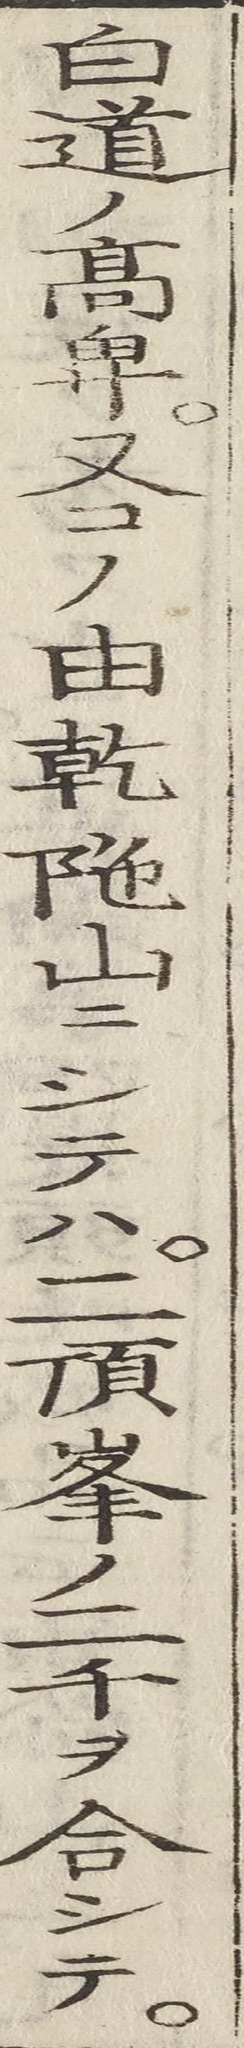白道ノ高卑。又コノ由乾陀山ニシテハ。二頂峯ノニ千ヲ合シテ。
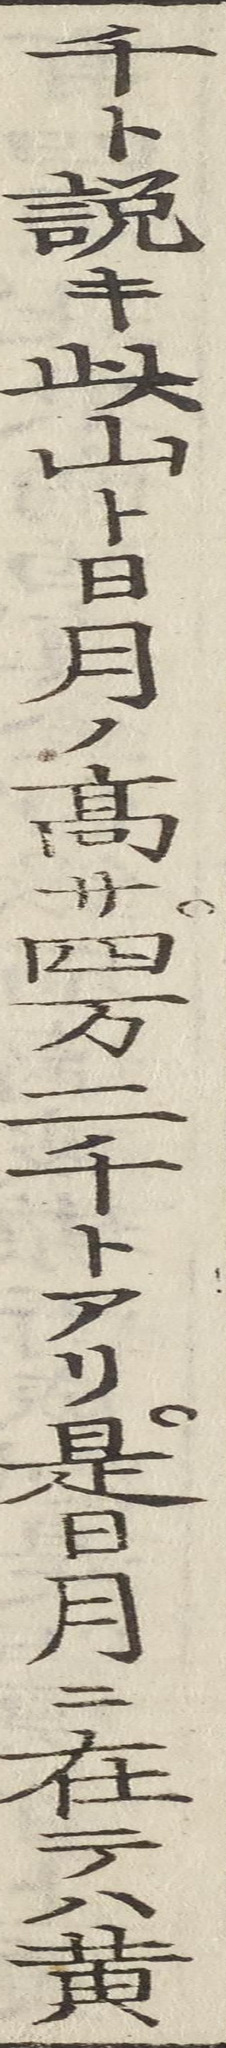千ト説キ此山ト日月ノ高サ。四万ニ千トアリ。是日月ニ在テハ黄
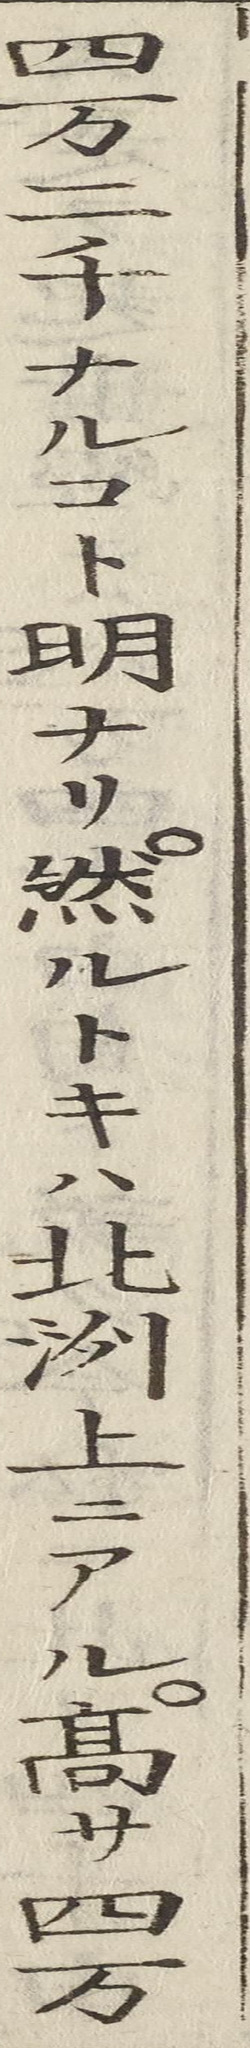四万ニ千ナルコト明ナリ。然ルトキハ北洲上ニアル。高サ四万
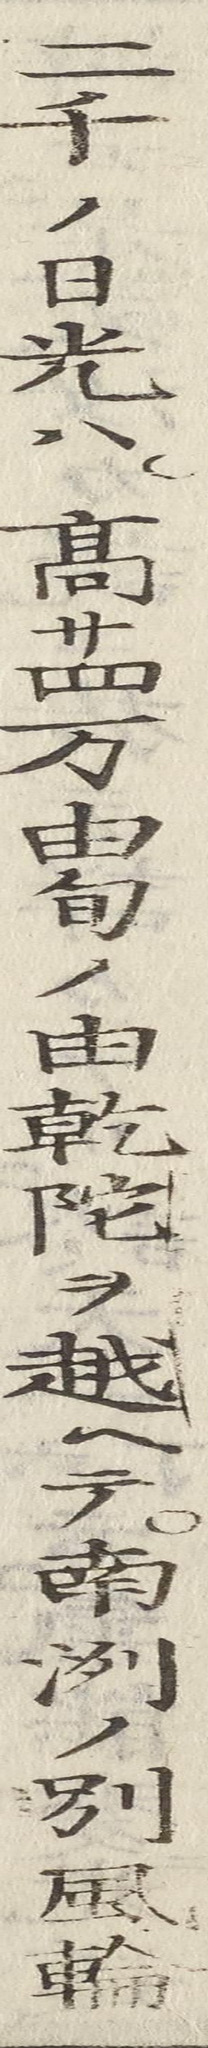ニ千ノ日光ハ。高サ四万由旬ノ由乾陀ヲ越ヘテ。南洲ノ別風輪
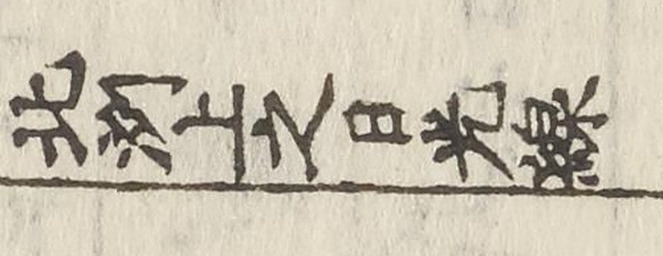北洲上之日光線
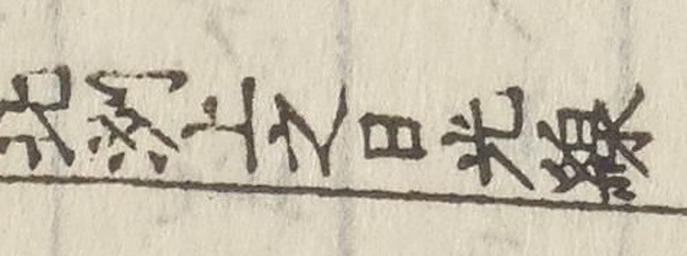北洲上之日光線

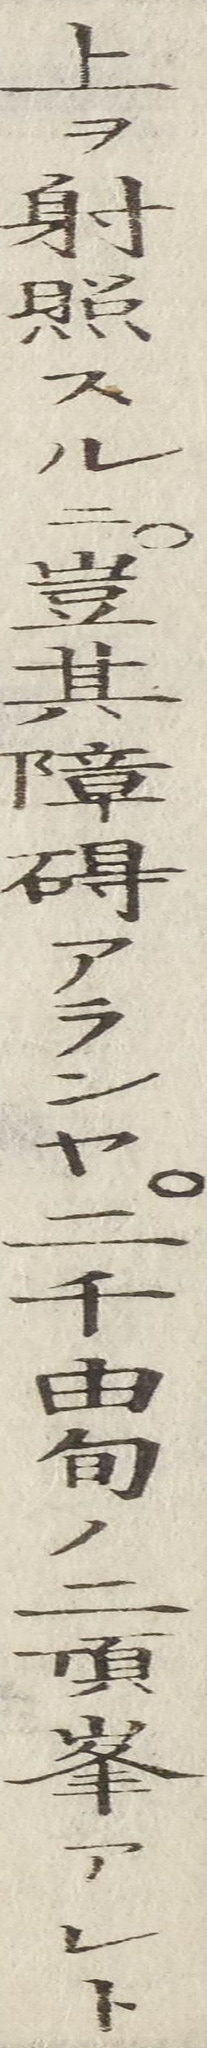上ヲ射照スルニ。豈其障碍アランヤ。ニ千由旬ノニ頂峯アレト
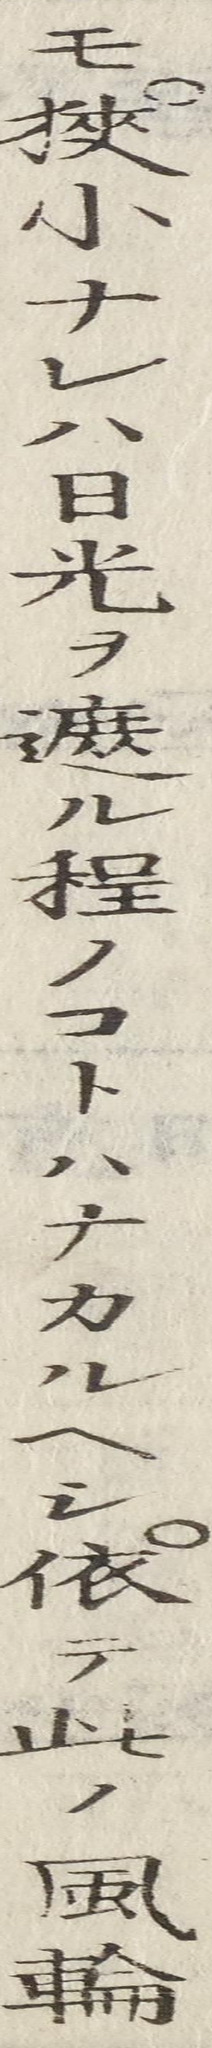モ。狭小ナレハ日光ヲ遮ル程ノコトハナカルヘシ。依テ此ノ風輪
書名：護法新論　二編　上
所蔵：東京大学地震研究所図書室 Earthquake Research Institute Library, The University of Tokyo, JAPAN
